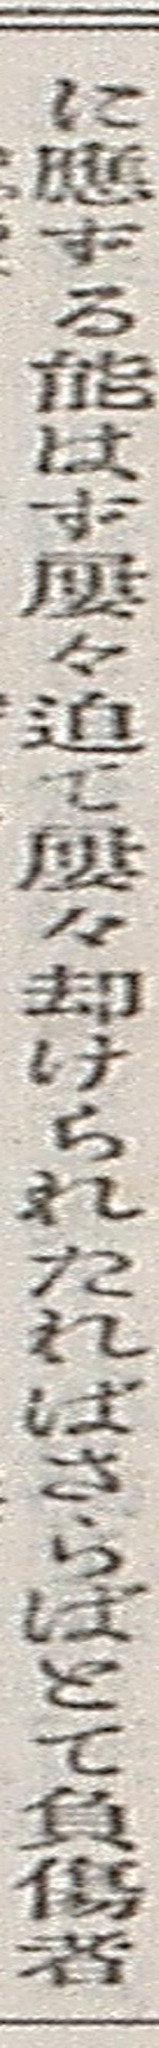に応ずる能はず屡々迫て屡々却けられたればさらばとて負傷者
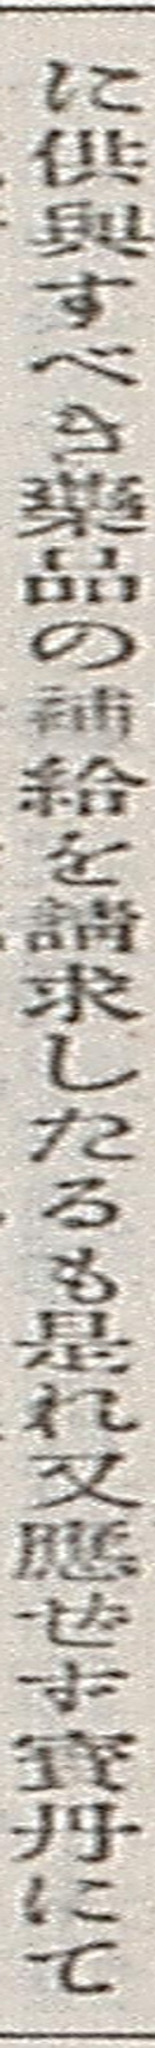に給与すべき薬品の補給を請求したるも是れ又応ぜず実丹にて
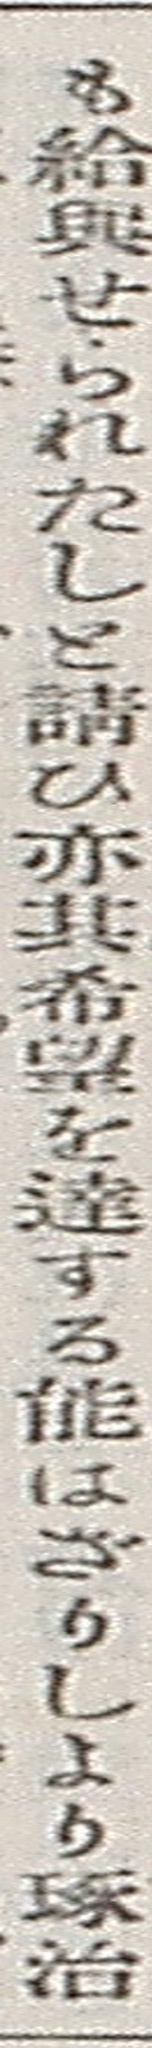も給与せられたしと請ひ亦其希望を達する能はざりしより琢治
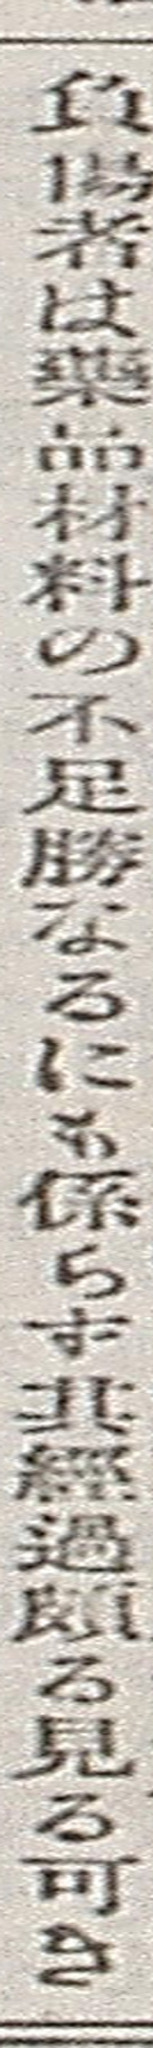負傷者は薬品材料の不足勝なるにも係らず其経過頗る見る可き
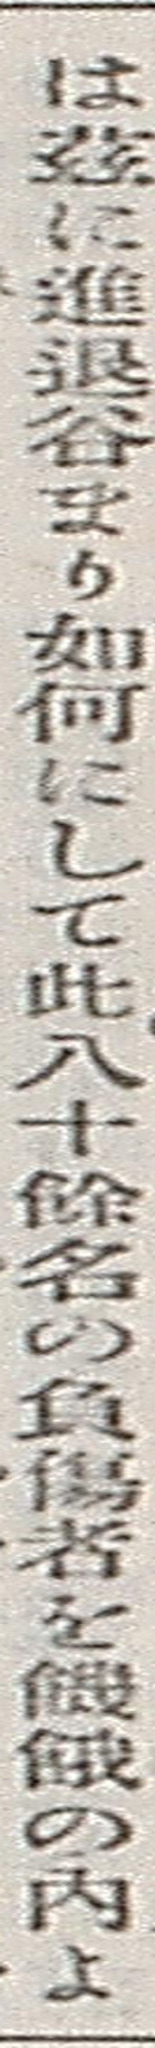は茲に進退谷まり如何にして此八十余名の負傷者を飢餓の内よ
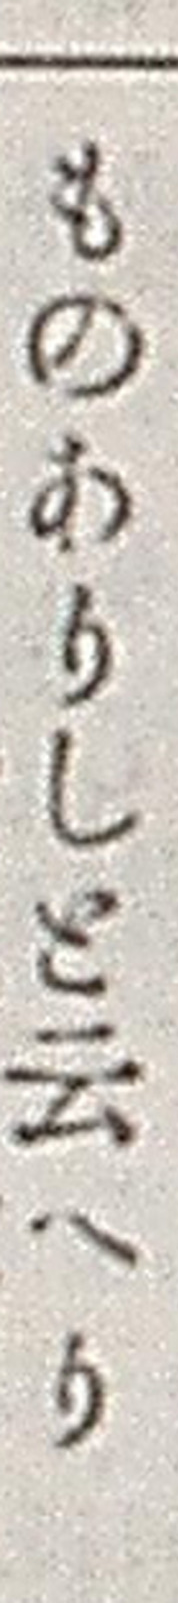ものありしと云へり
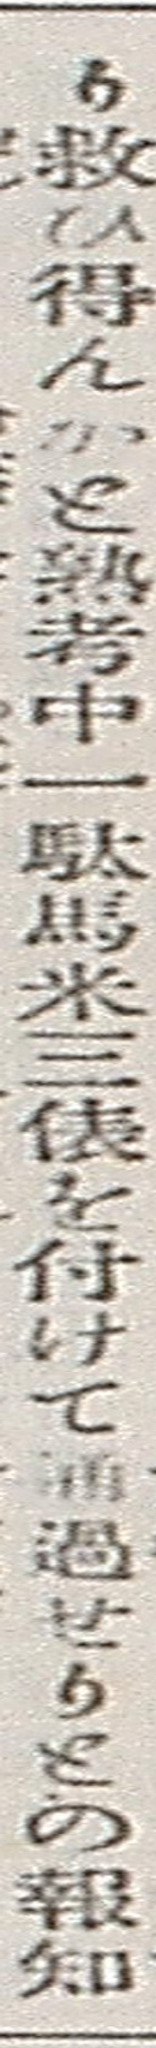り救ひ得んかと熟考中一駄馬米三俵を付けて通過せりとの報知
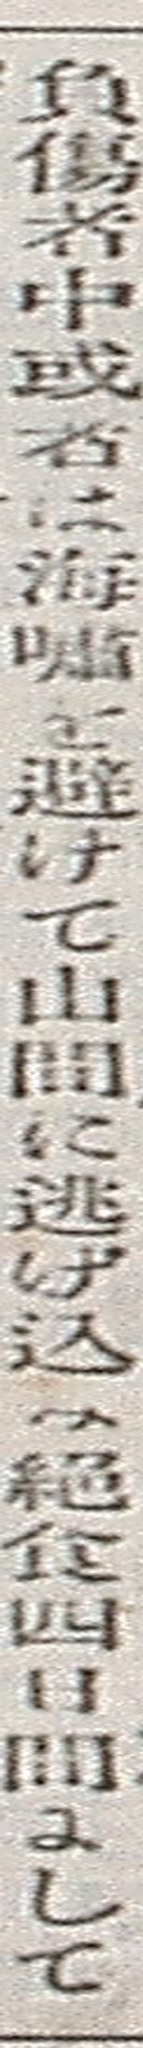負傷者中或者は海嘯を避けて山間に逃げ込み絶食四日間にして
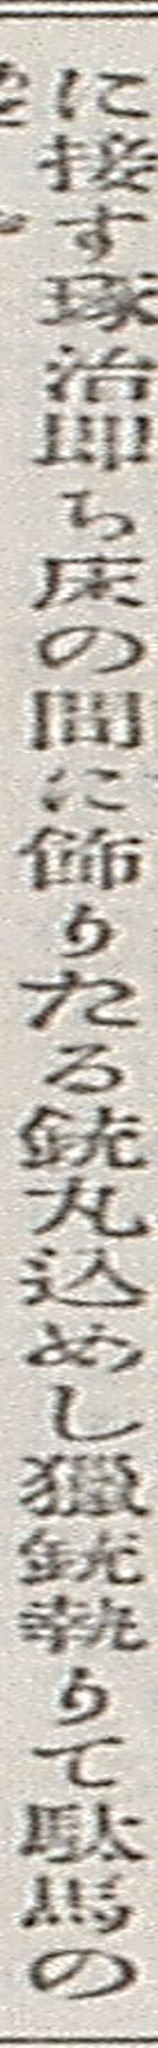に接す琢治即ち床の間に飾りたる銃丸込めし猟銃執りて駄馬の
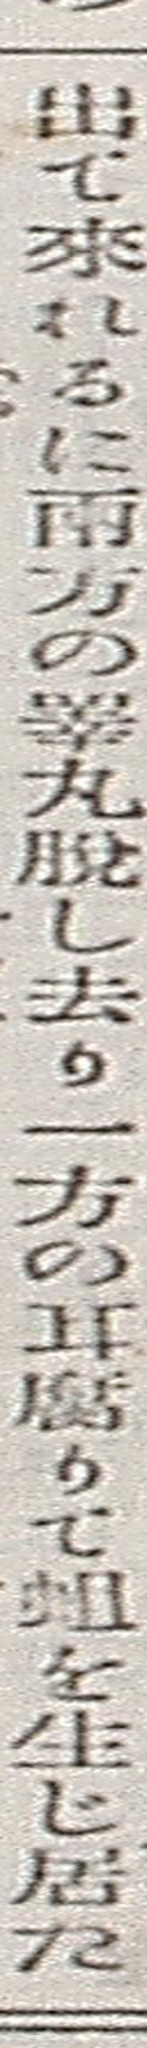出て来れるに両方の睾丸脱し去り一方も耳腐りて蛆を生じ居た
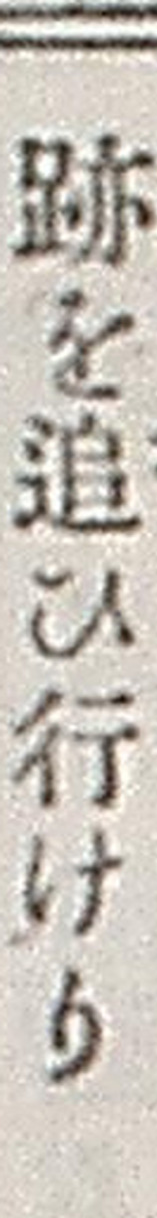跡を負ひ行けり
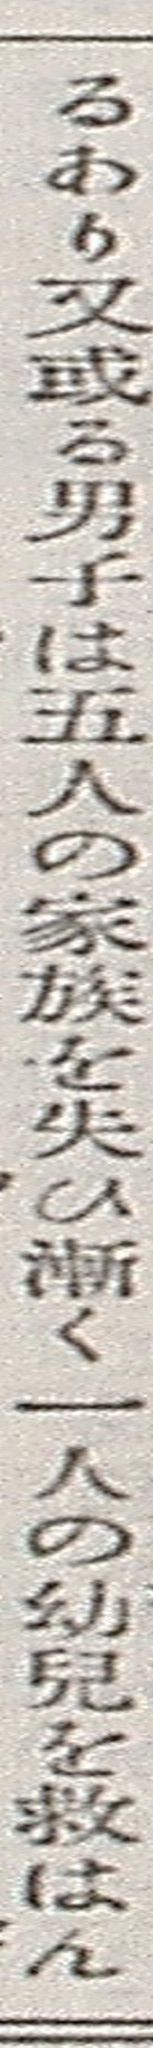るあり又或る男子は五人の家族を失ひ漸く一人の幼兒を救はん
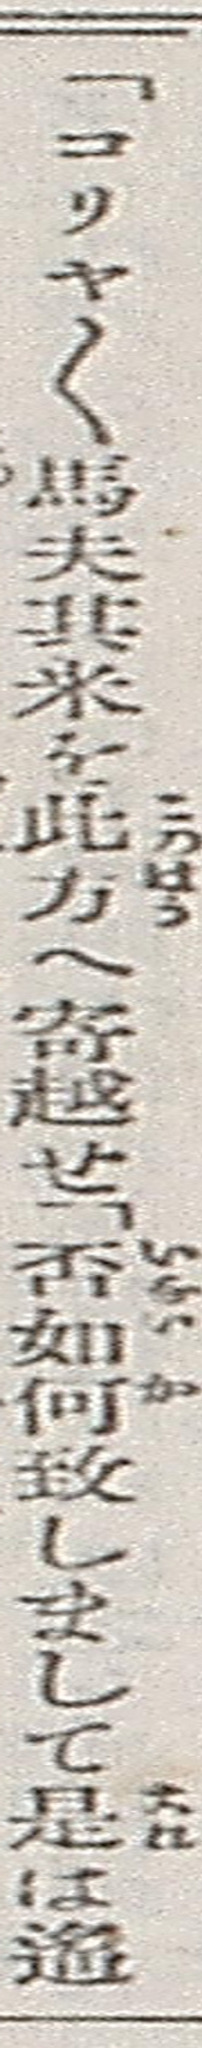「コリャ〳〵馬夫某米を此方へ寄せ越せ「否如何致しまして是は遙
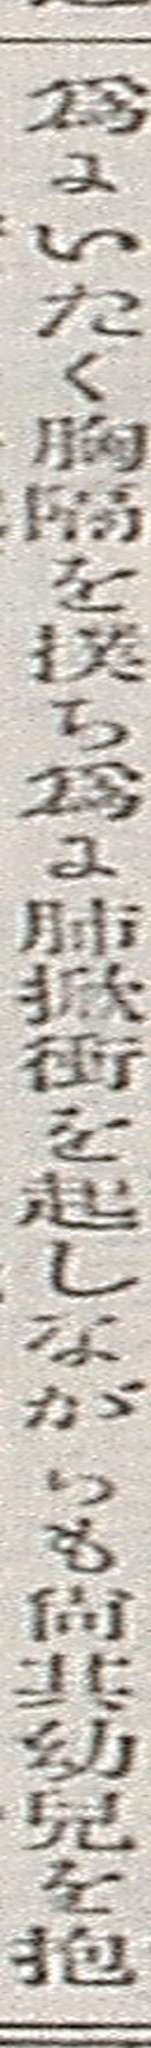為にいたく胸隔を撲ち為に肺掀衝を起しながらも尚其幼兒を抱
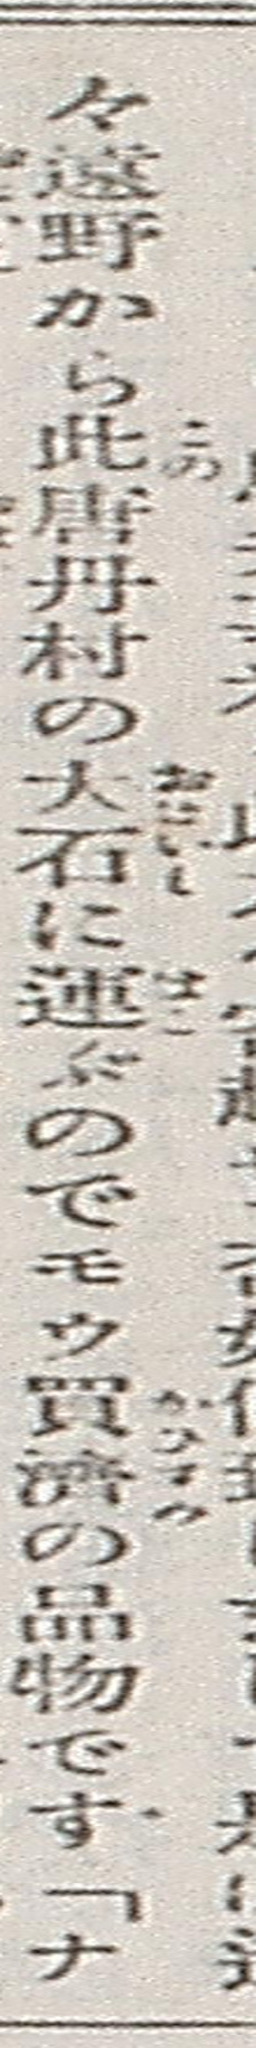々遠野から此唐丹村の大石に運ぶのでモウ買済の品物です「ナ
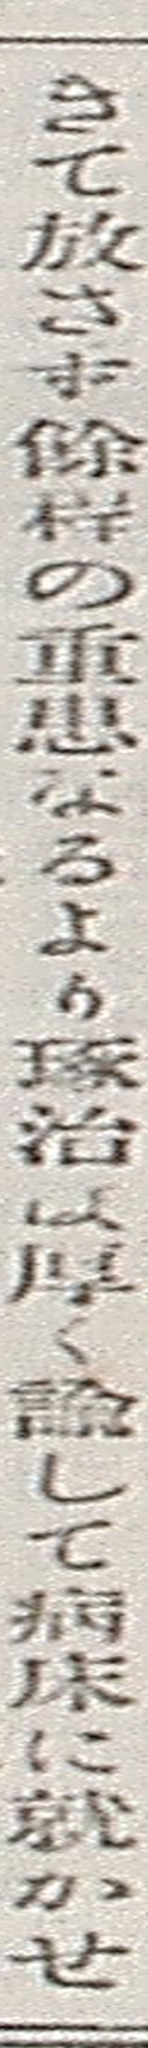きて放さず余程の重患なるより琢治は厚く諭して病床に就かせ
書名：風俗畫報臨時増刊第百二十號　大海嘯被害録（下）
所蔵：東京大学地震研究所図書室 Earthquake Research Institute Library, The University of Tokyo, JAPAN
